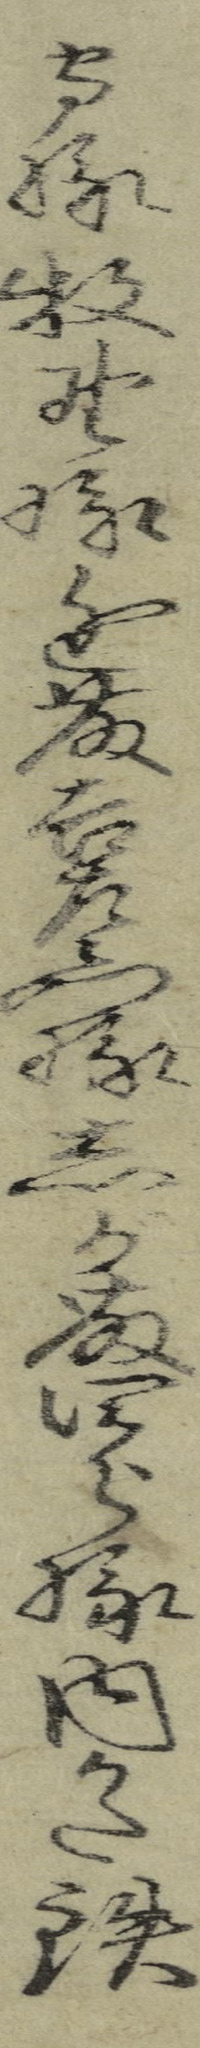守様牧野様近藤吉左衛門様しが藤四郎様内かた鉄
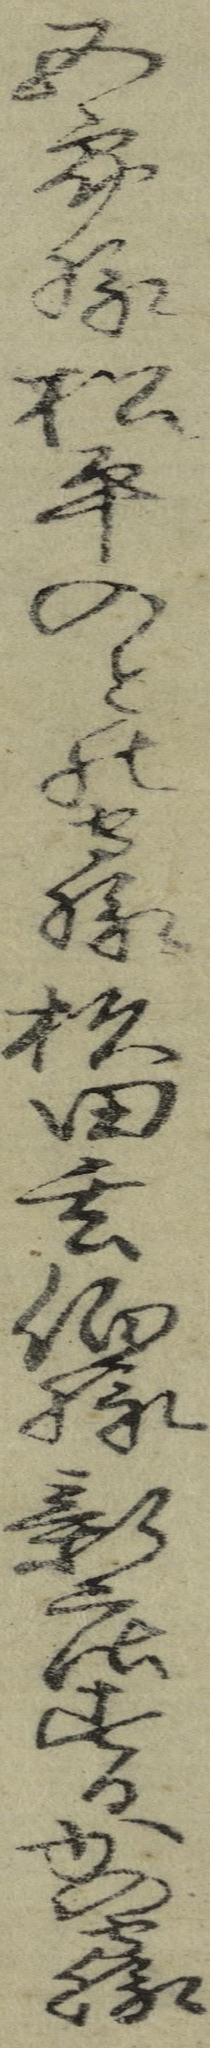五郎様松平のとの守様杉田玄伯様新庄するかの守様
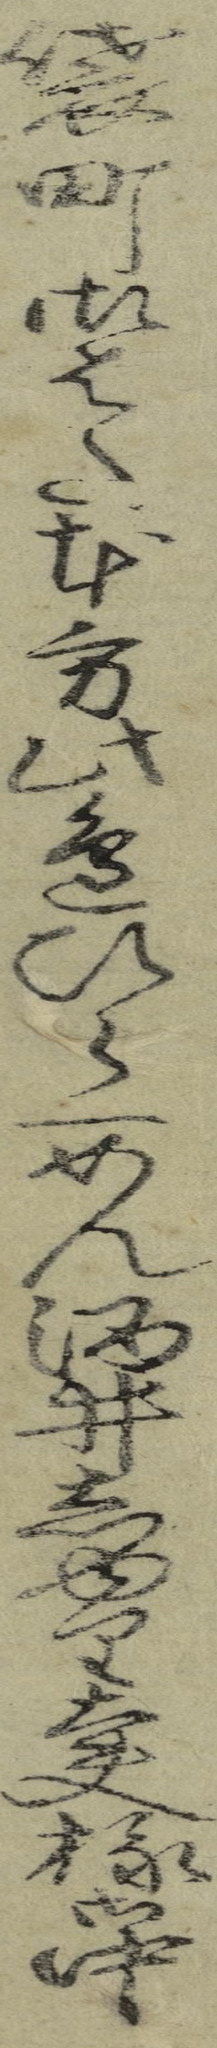袋町御はた本方此辺ひら一めん酒井しゆり太夫様御中
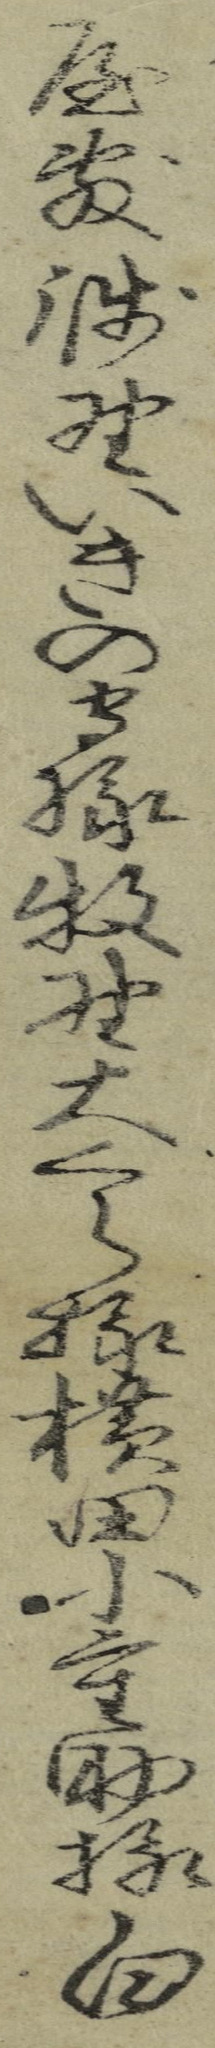屋敷浅野いきの守様牧野大くら様横田小重助様白
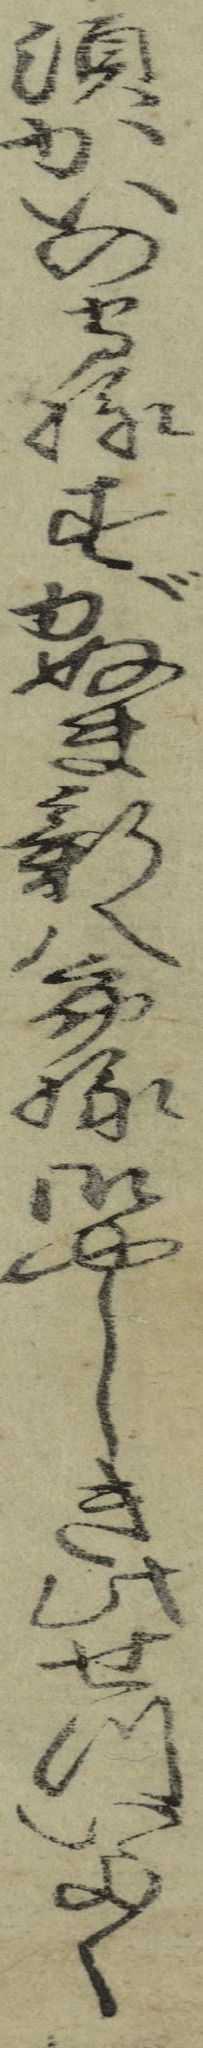須かいの守様すがぬま新八郎様御やしき此せついよ〳〵
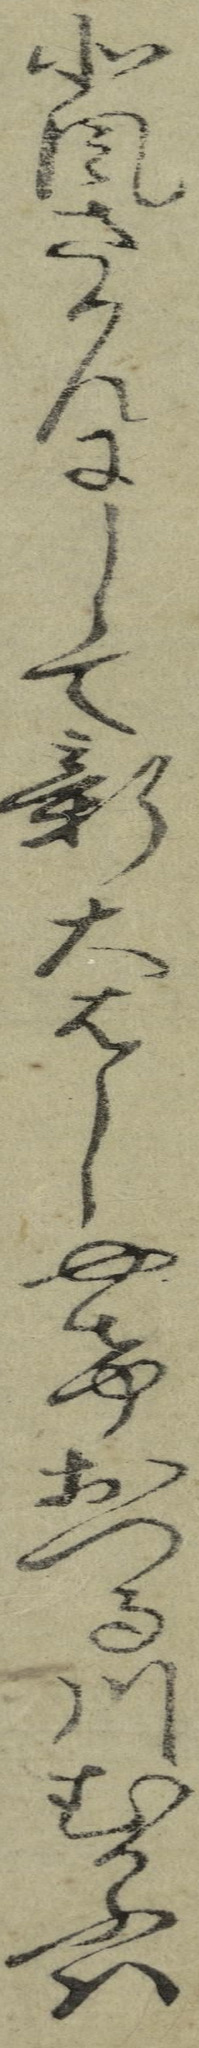北風さかんにして新大はしやけおつる川むかふハ
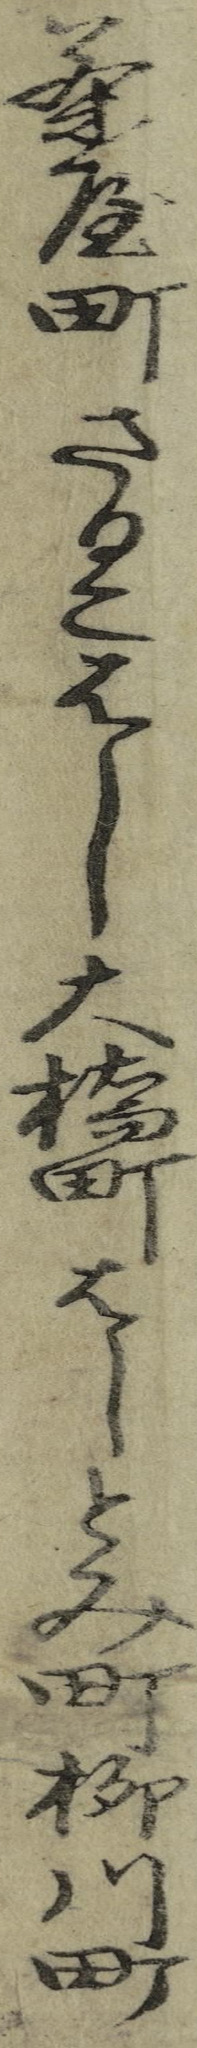茶屋町さるこはし大橋町はしとみ町柳川町
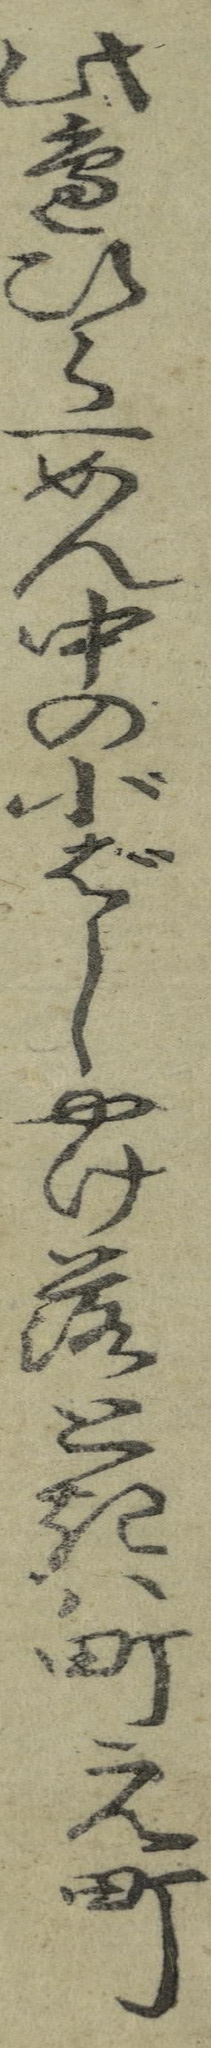此辺ひら一めん中の小ばしやけ落ときハ町元町
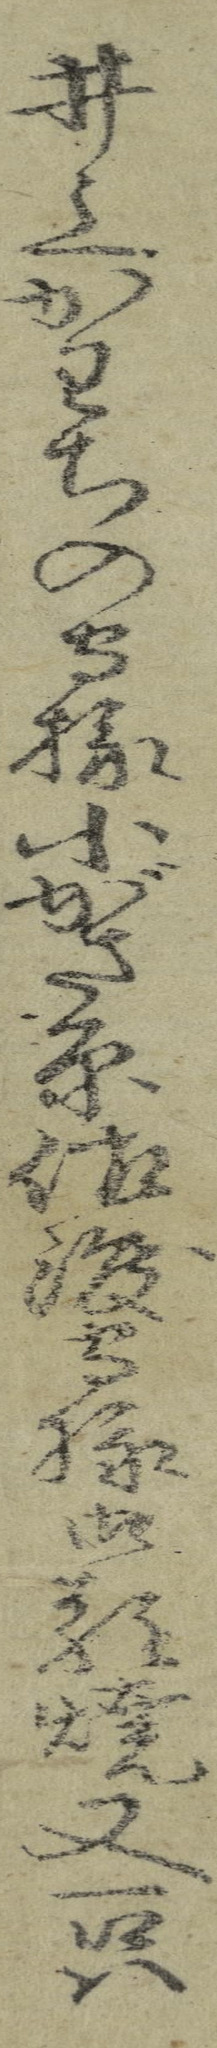井上かわちの守様.小がさ原佐渡守様御類焼又一口ハ
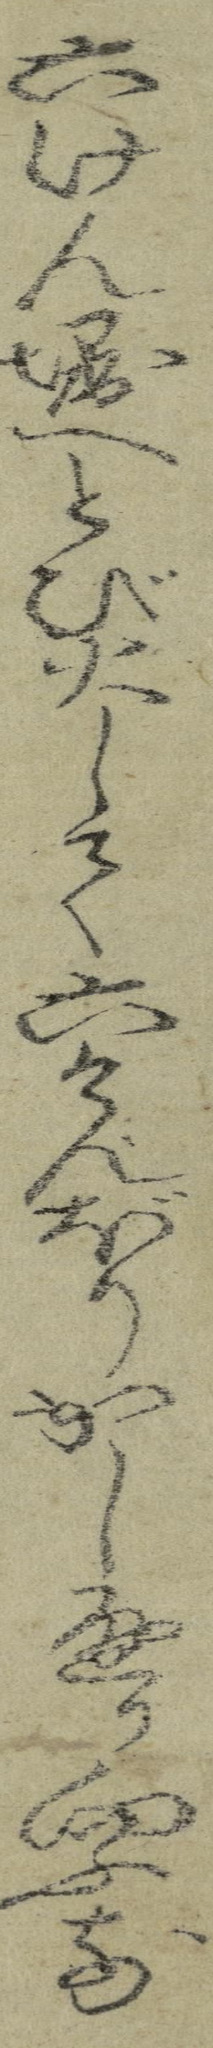六けん堀へとび火して六けんぼりかし通り向ふ前
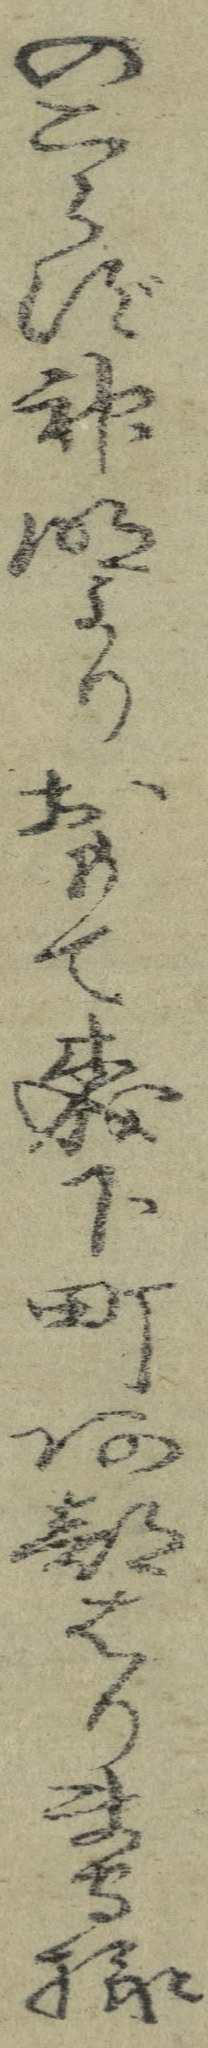のこらず神明よりおもて森下町阿部はりま守様
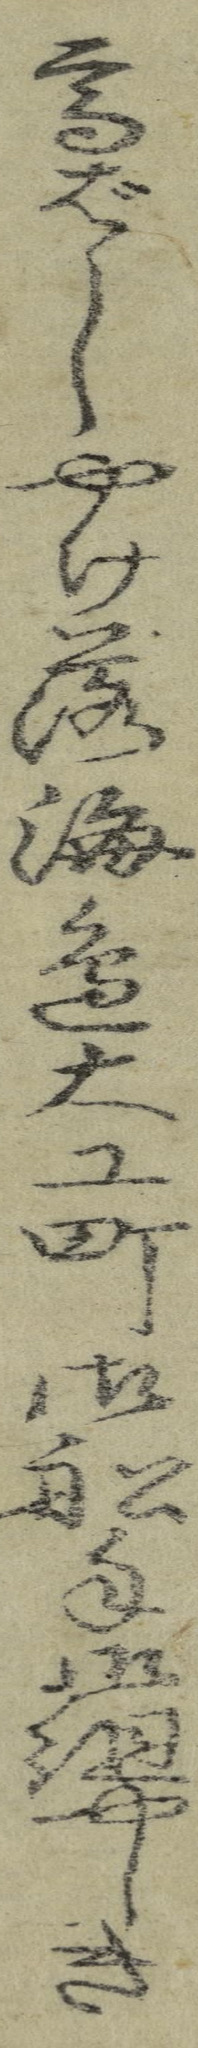馬ばしやけ落海辺大工町御船手御組やしき
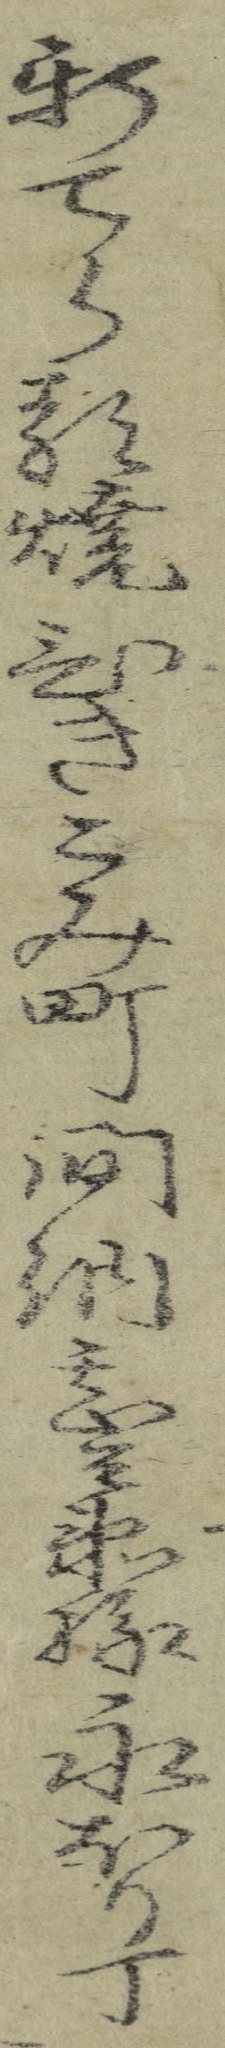新てら類焼ひきこみ町間納甚兵衛様永ほり丁
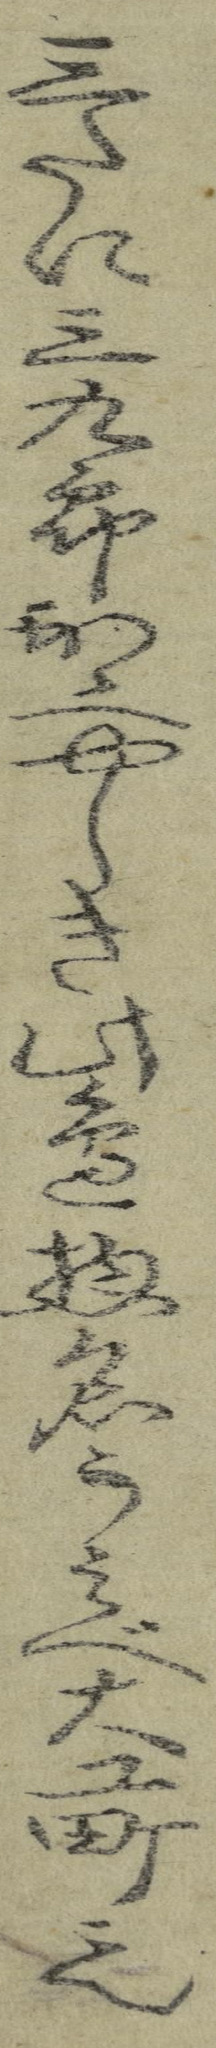三たに三九郎かゝへやしき此辺惣急うらべ大工町元
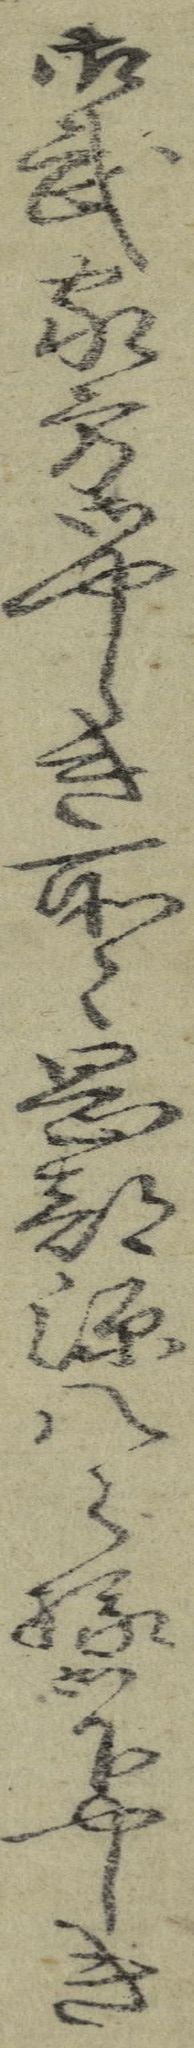御武家方御やしき所々岡部源八郎様御下やしき
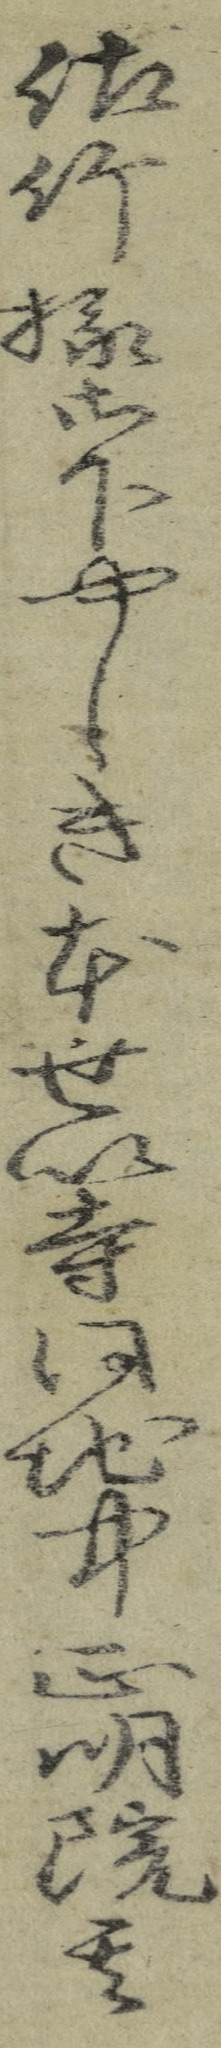佐竹様御下やしき本せい寺同地中正明院其
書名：出火場道しらべ
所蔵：東京大学地震研究所図書室 Earthquake Research Institute Library, The University of Tokyo, JAPAN
